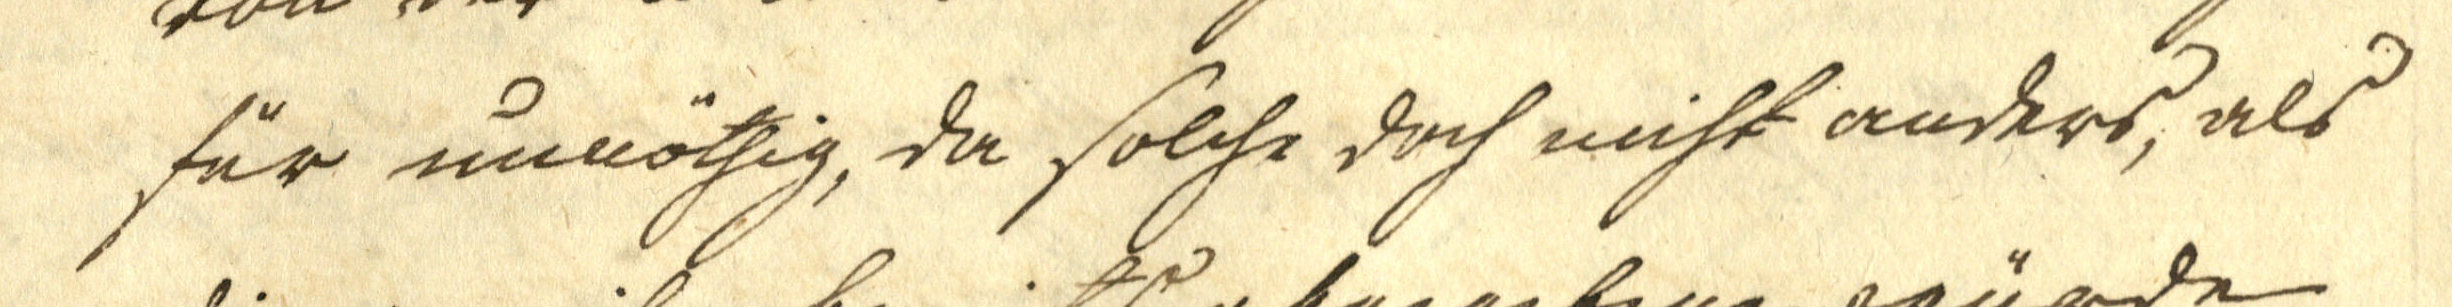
für unnöthig, da solche doch nicht anders, als
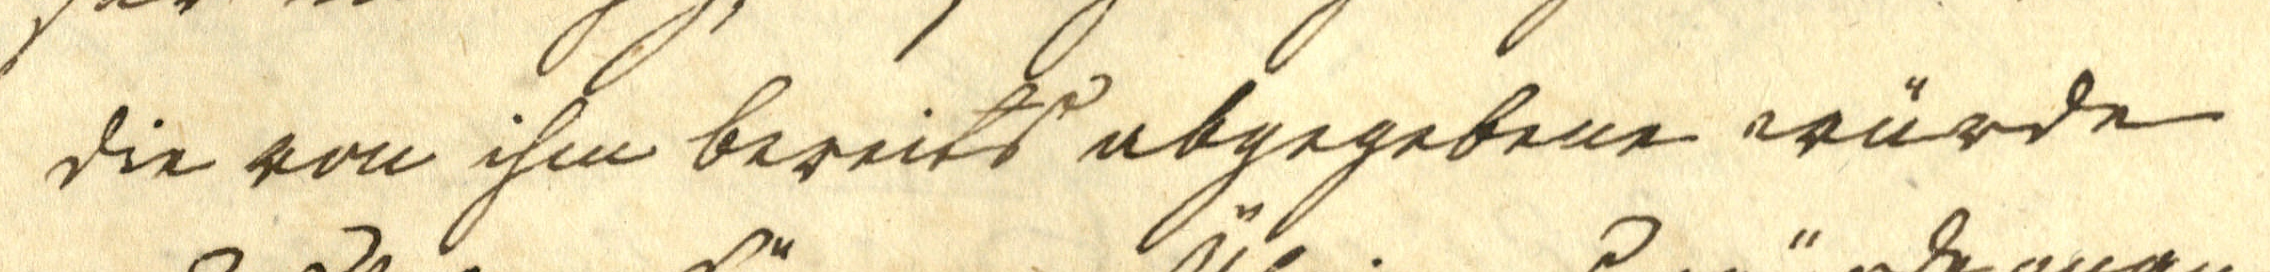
die von ihm bereits abgegebene würde
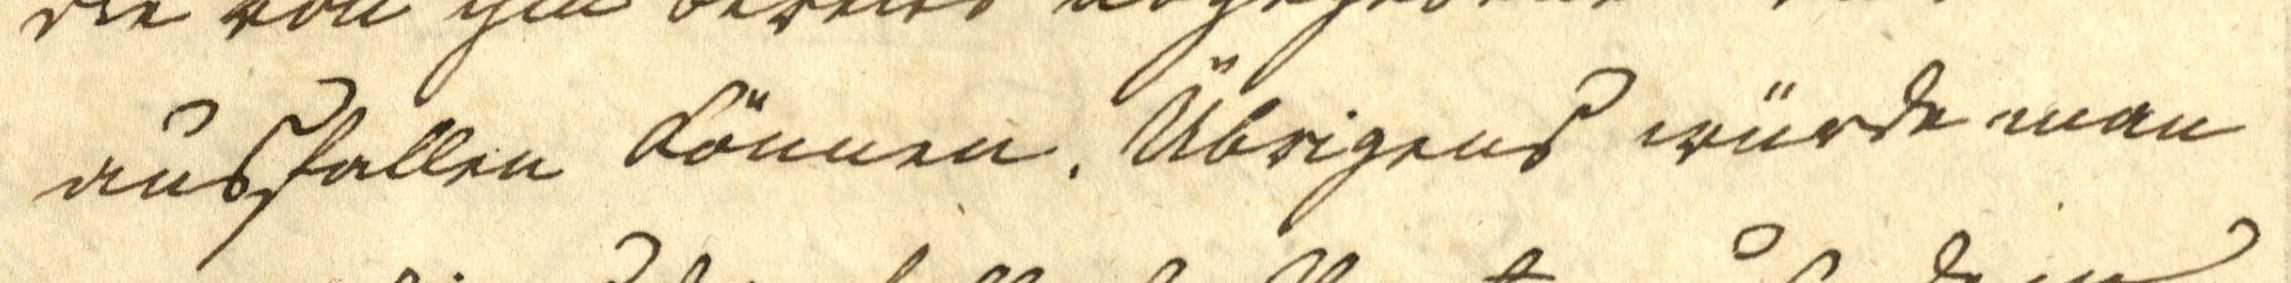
ausfallen können. Übrigens würde man
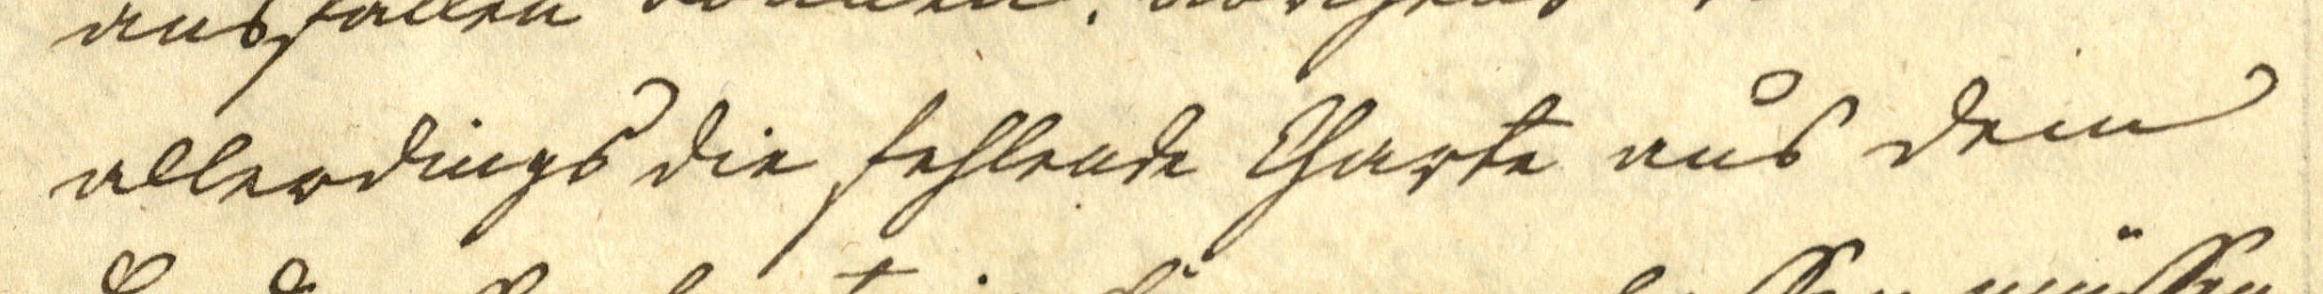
allerdings die fehlende Charte aus dem
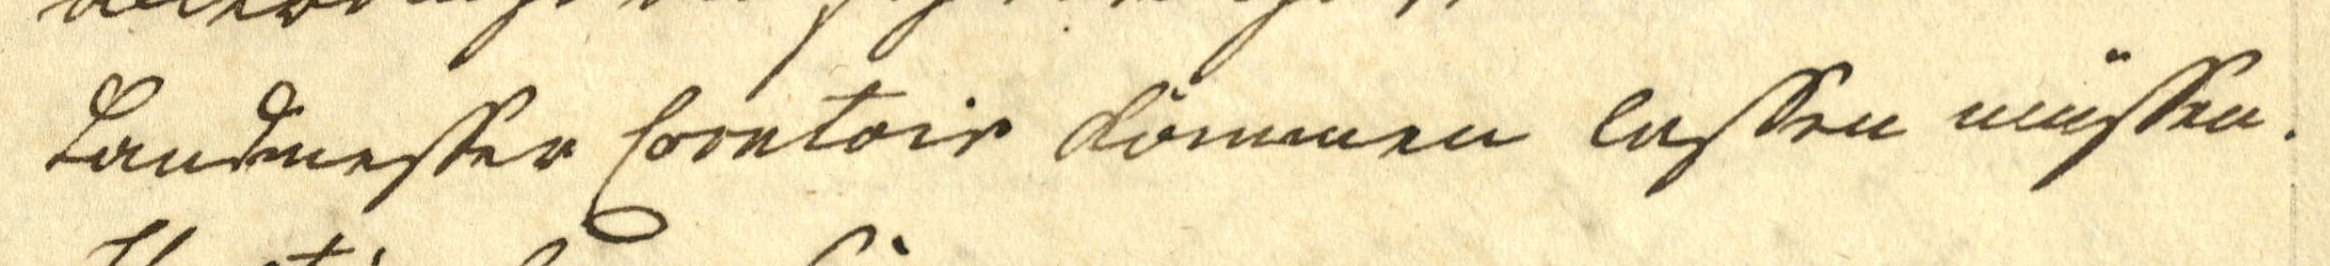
Landmesser Comtoir kommen lassen müssen.
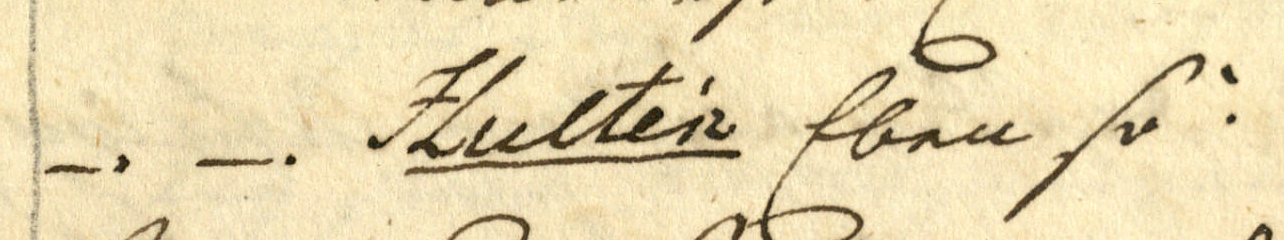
Hultén Eben so.
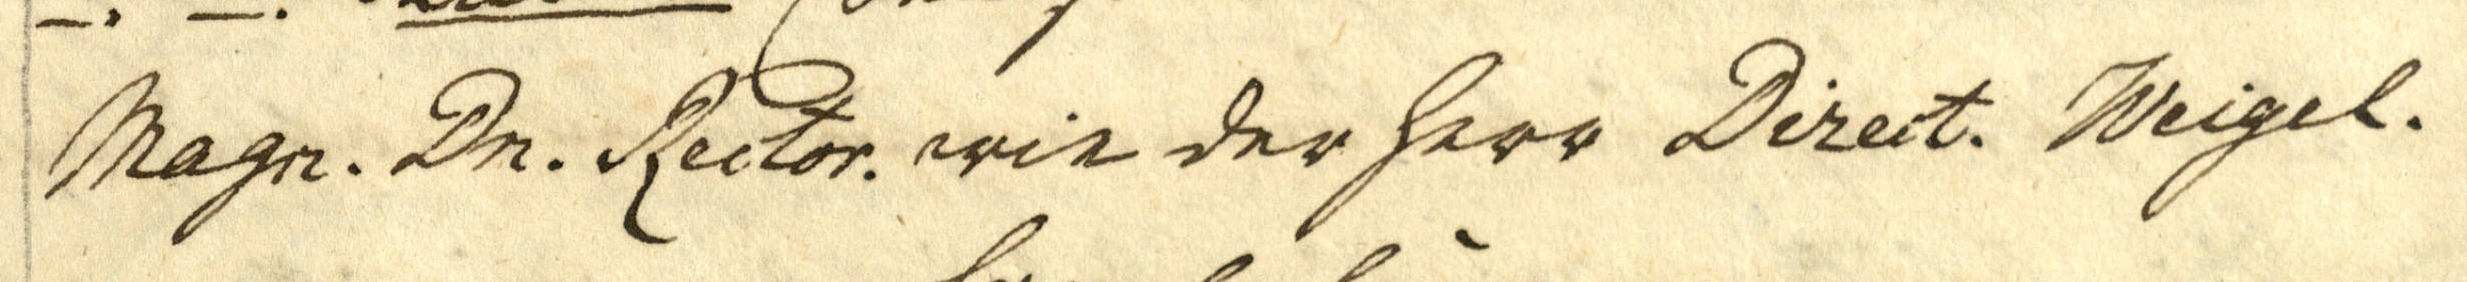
Magn. Dn. Rector. wie der Herr Direct. Weigel.
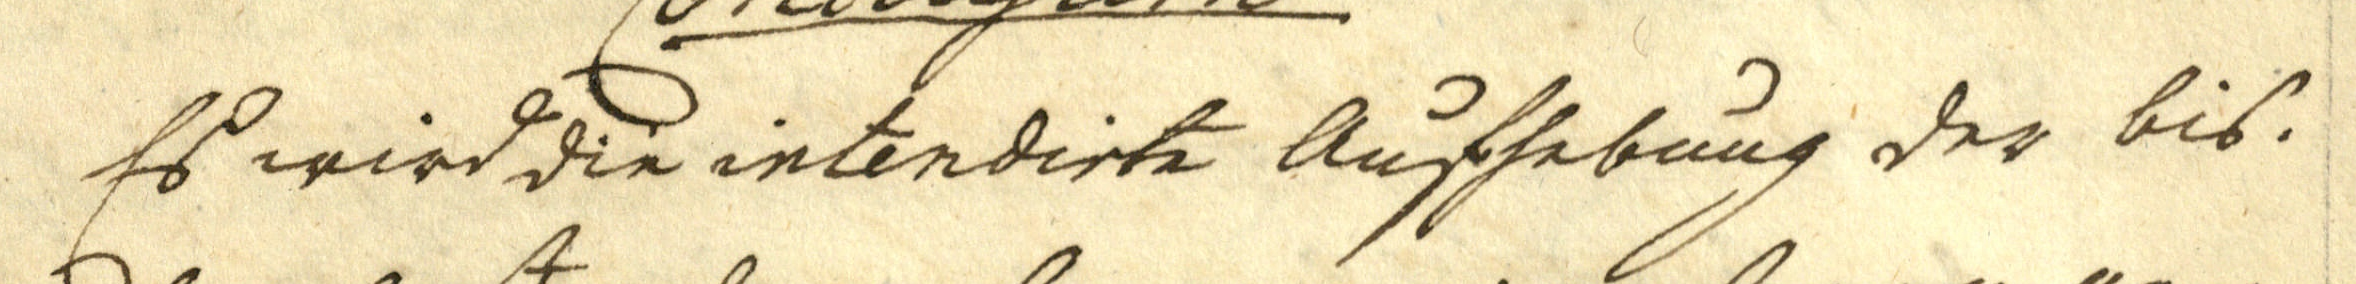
Es wird die intendirte Aufhebung der bis¬
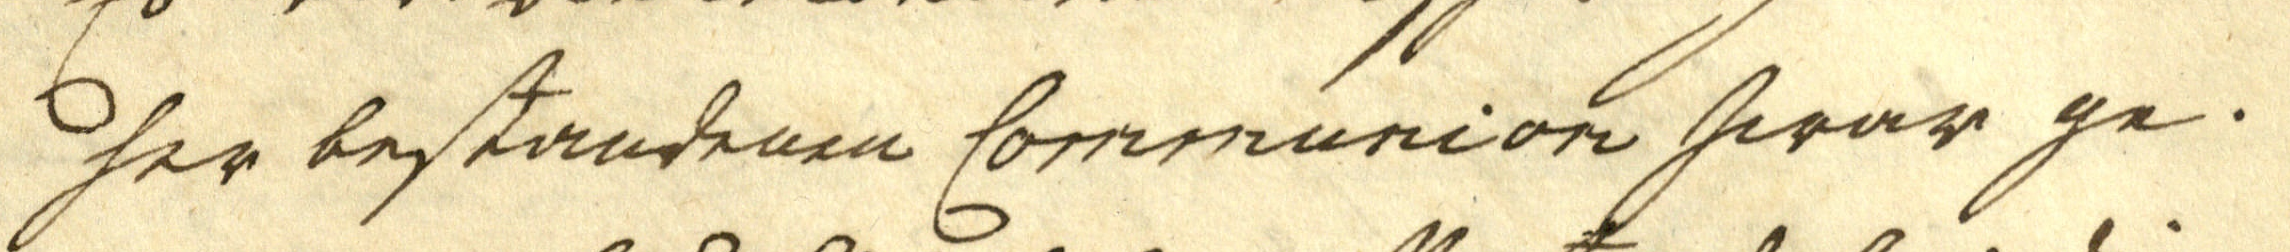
her bestandenen Communion zwar ge¬
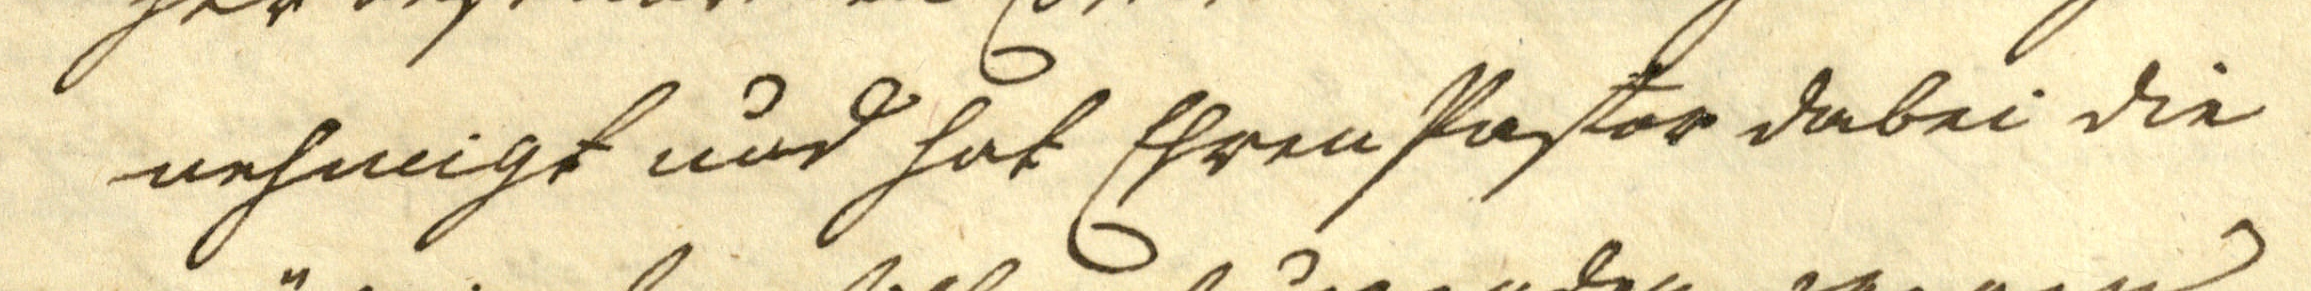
nehmigt und hat Ehren Pastor dabei die
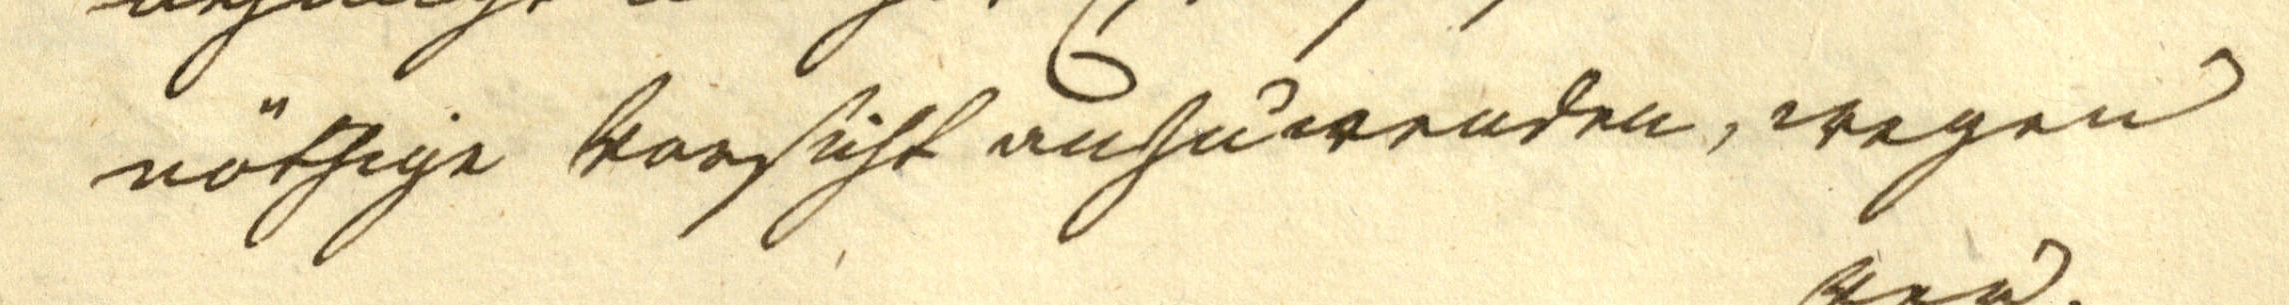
nöthige Vorsicht anzuwenden, wegen
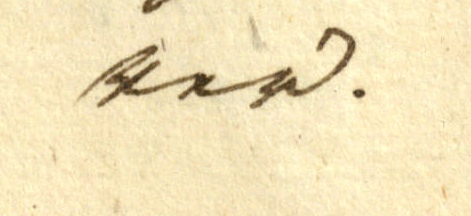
ver-
